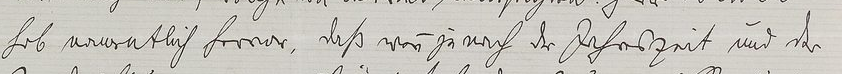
hob namentlich hervor, daß wenn je nach der Jahreszeit und der
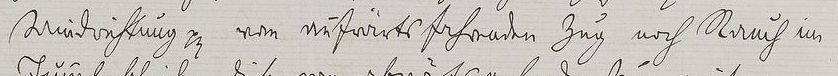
Windrichtung pp vom aufwärts fahrenden Zug noch Rauch im
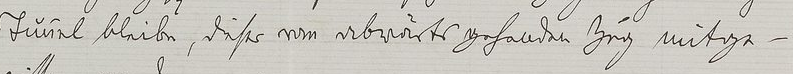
Tunnel bleibe, dieser vom abwärts gehenden Zug mitge-
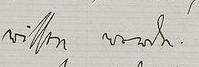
rissen werde.
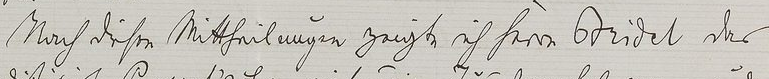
Nach diesen Mittheilungen zeigte ich Herrn Bridel das
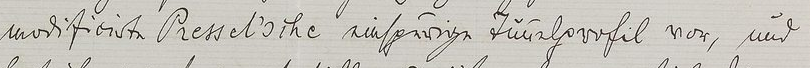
modificirte Pressel'sche einspurige Tunnelprofil vor, und
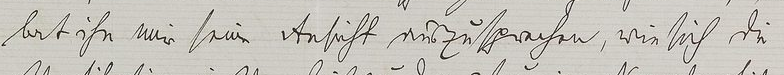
bat ihn mir seine Ansicht auszusprechen, wie sich die
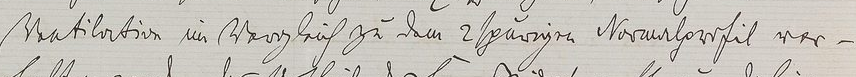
Ventilation im Vergleich zu dem 2spurigen Normalprofil ver-
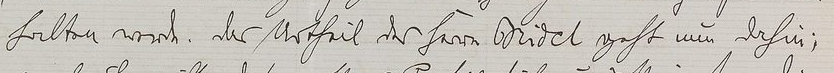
halten werde. Das Urtheil des Herrn Bridel geht nun dahin:
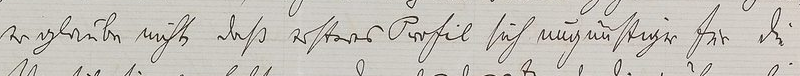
er glaube nicht, daß ersteres Profil sich ungünstiger für die
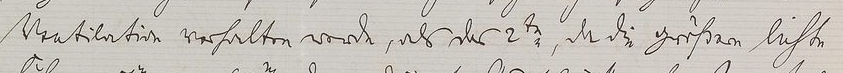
Ventilation verhalten werde, als das 2te, da die größere lichte
